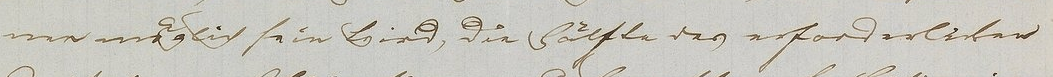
nen möglich sein wird, die Hälfte des erforderlichen
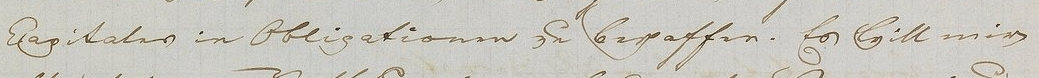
Capitales in Obligationen zu beschaffen. Es will mir
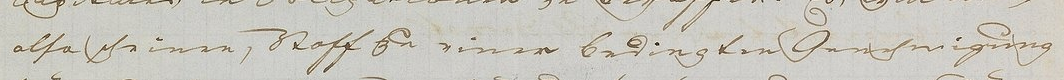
also scheinen, Stoff zu einer bedingten Genehmigung
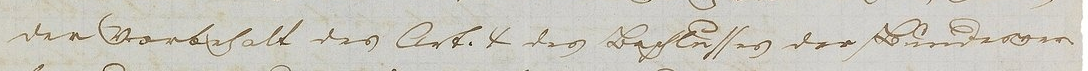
der Vorbehalt des Art. 4 des Beschlusses der Bundesver-
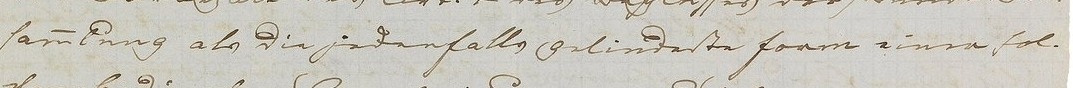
sammlung als die jedenfalls gelinderte Form einer sol-
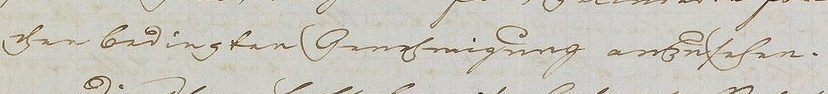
chen bedingten Genehmigung anzusehen.
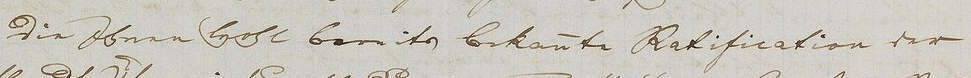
Die Ihnen wohl bereits bekannte Ratification der
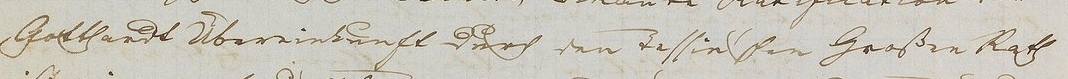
Gotthardt Übereinkunft durch den Tessin'schen Großen Rath
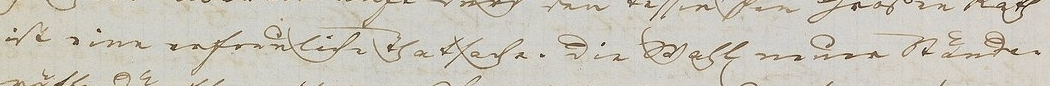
ist eine erfreuliche Thatsache. Die Wahl neuer Stände-
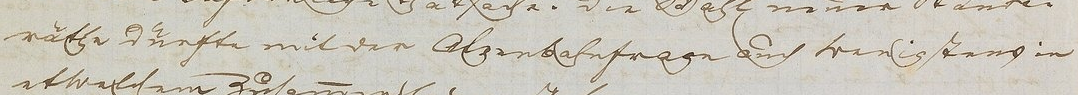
räthe dürfte mit der Alpenbahnfrage auch wenigstens in
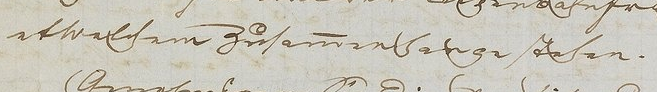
etwelchem Zusammenhange stehen.
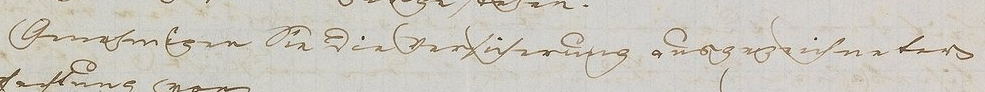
Genehmigen Sie die Versicherung ausgezeichneter
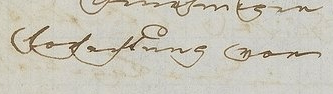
Hochachtung von
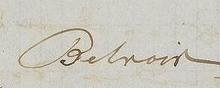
Belvoir
